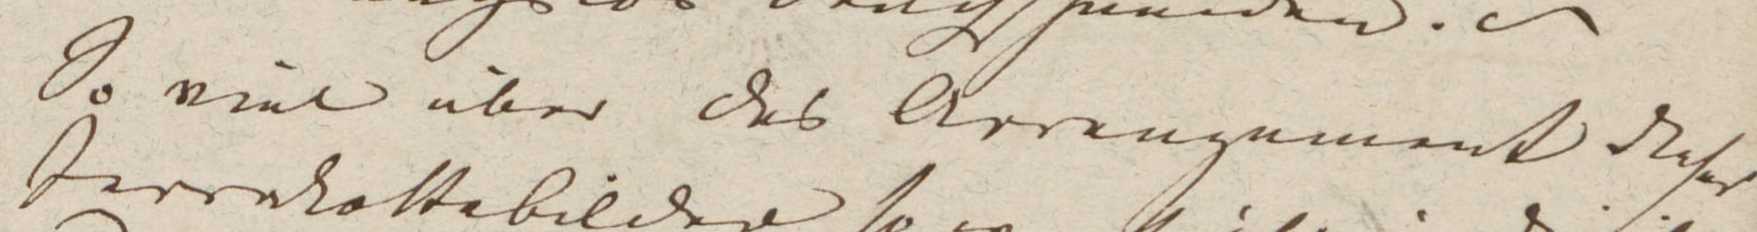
So viel über das Arrangement dieser
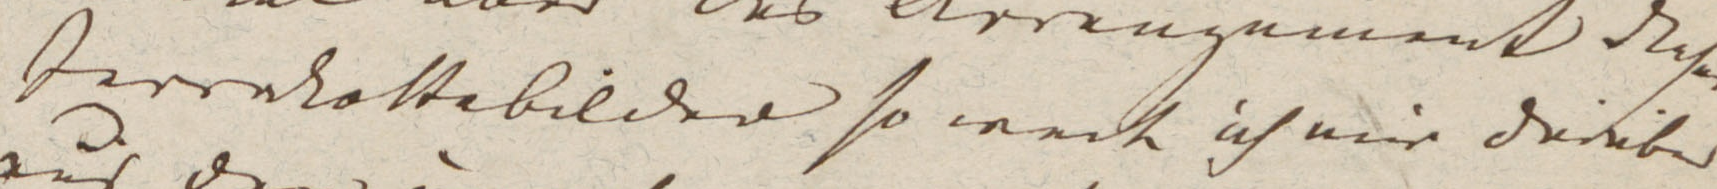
Terrakottabilder so weit ich mir darüber
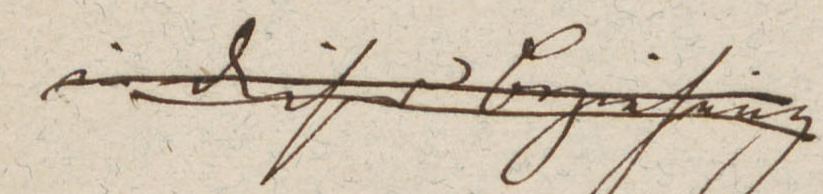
in dieser Beziehung
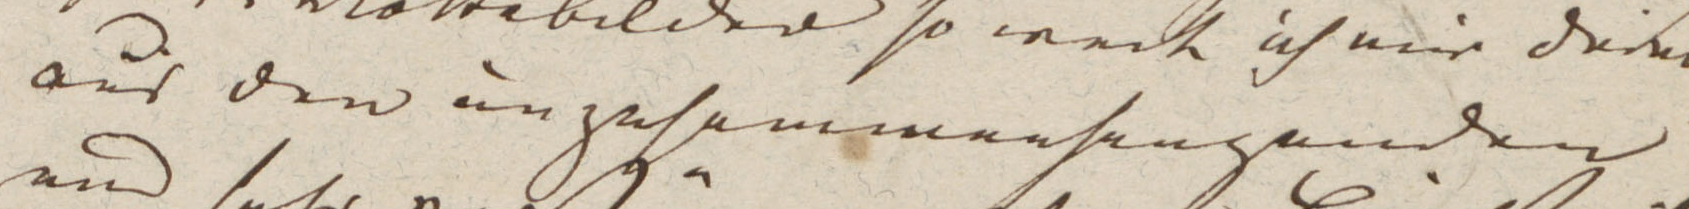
aus den unzusammenhangenden
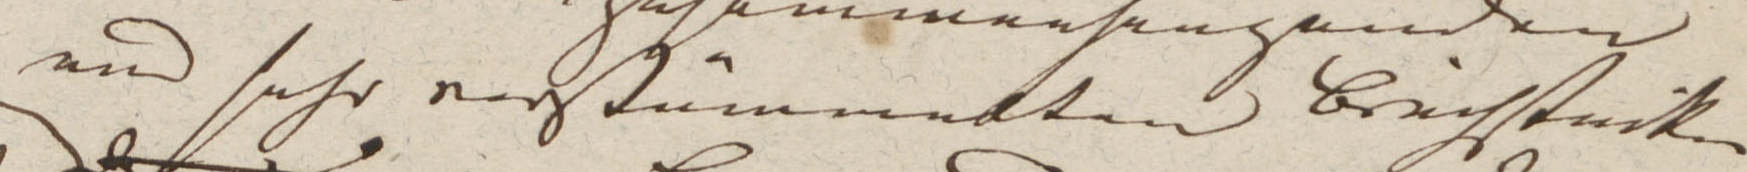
und sehr verstümmelten Bruchstücken
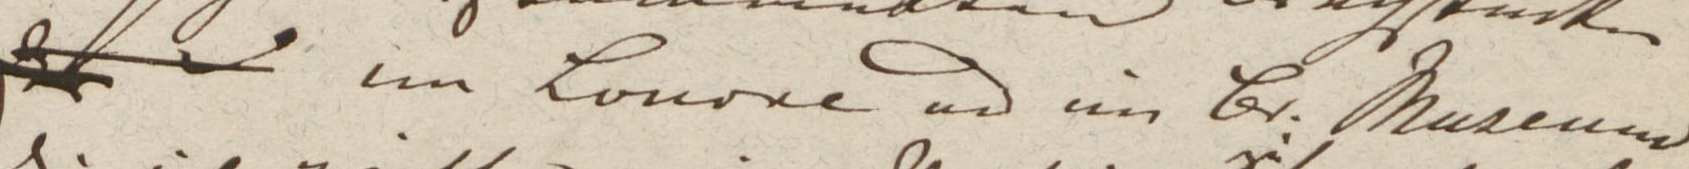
des im Louvre und im Br. Museum
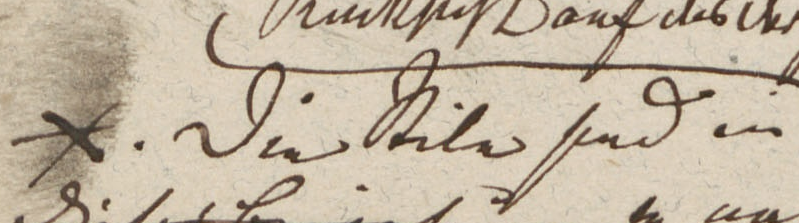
% Die Stile sind
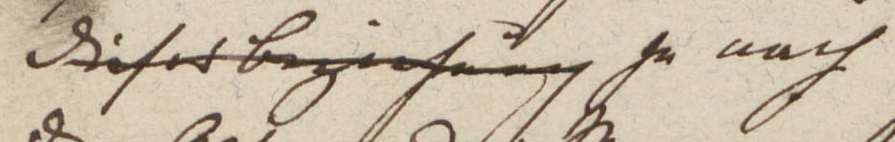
dieser Beziehung je nach
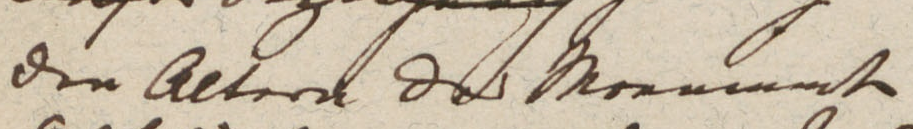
den Altern der Monumente
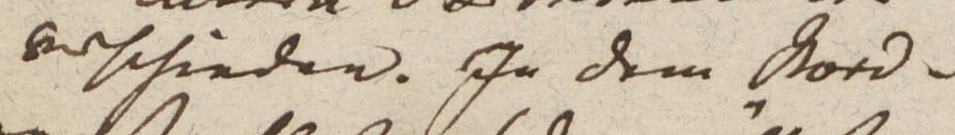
verschieden. In dem Nord-
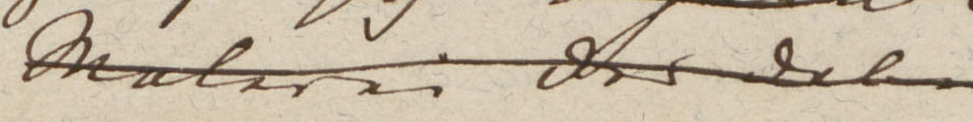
Malerei der dabei
